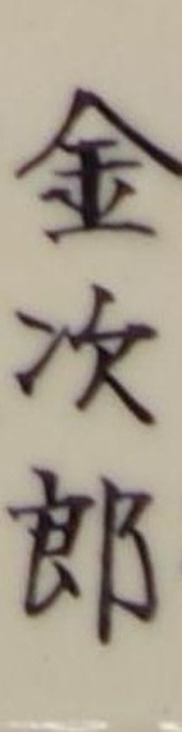金次郎
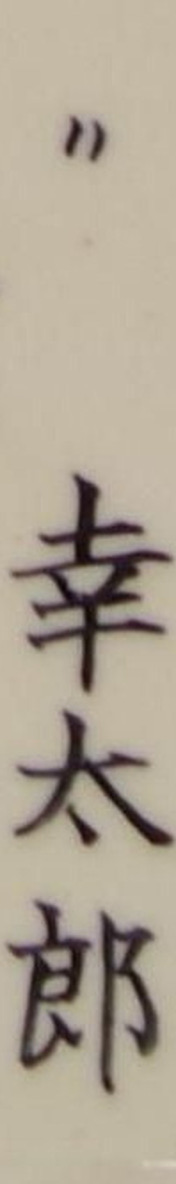幸太郎
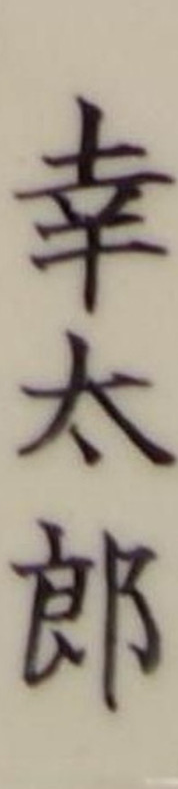幸太郎
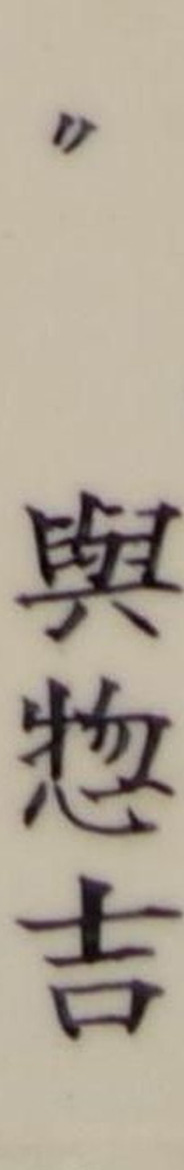與惣吉
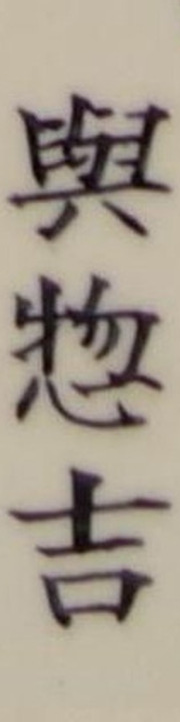與惣吉
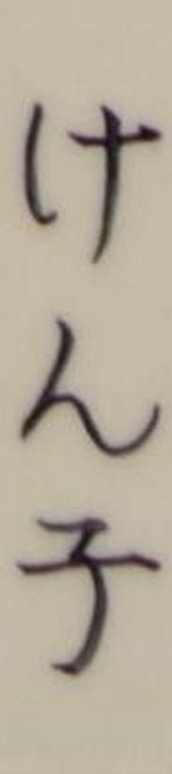けん子
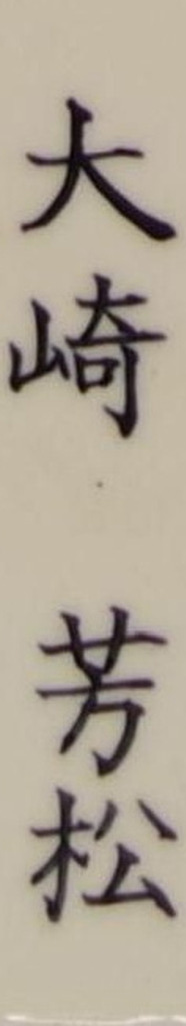大崎芳松
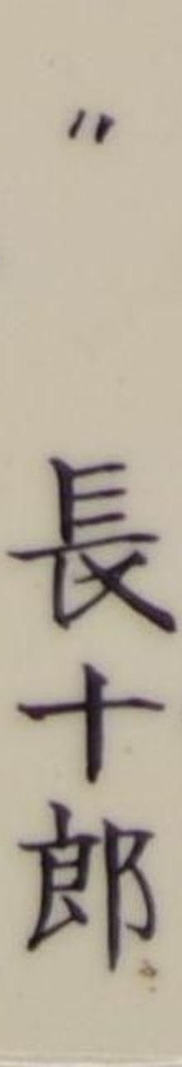長十郎
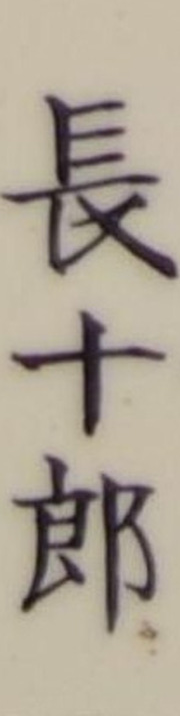長十郎
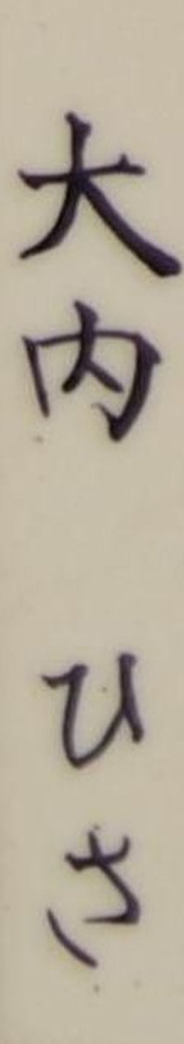大内ひさ

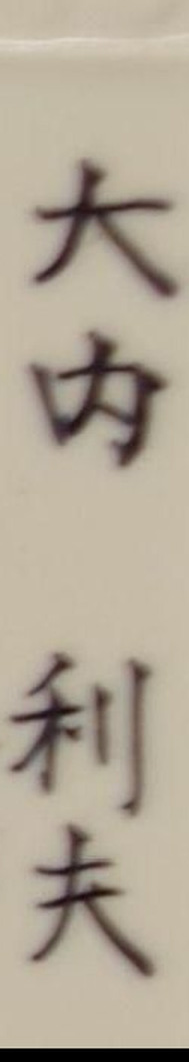大内利夫
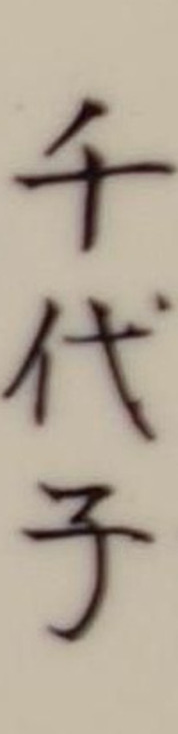千代子
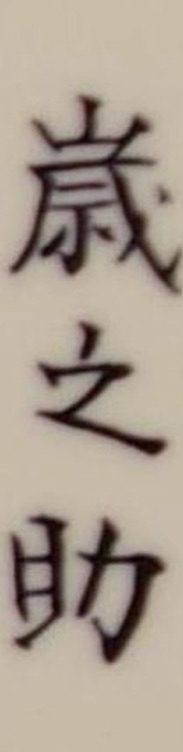崴之助
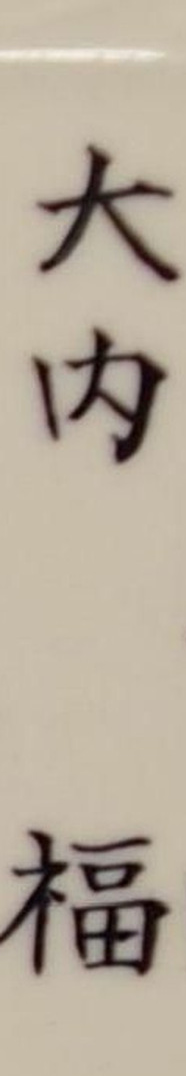大内福
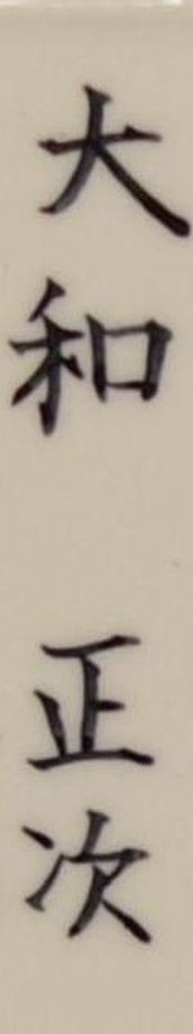大和正次
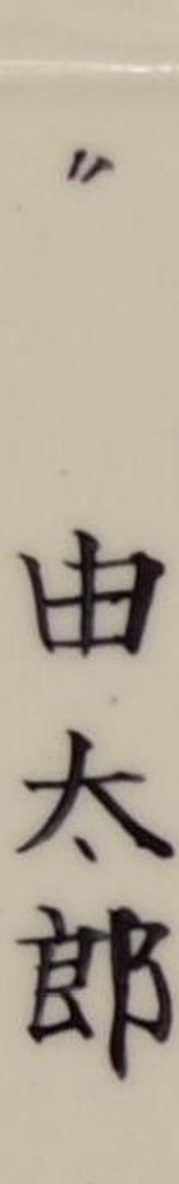由太郎
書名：M~S
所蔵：高野山金剛峯寺
